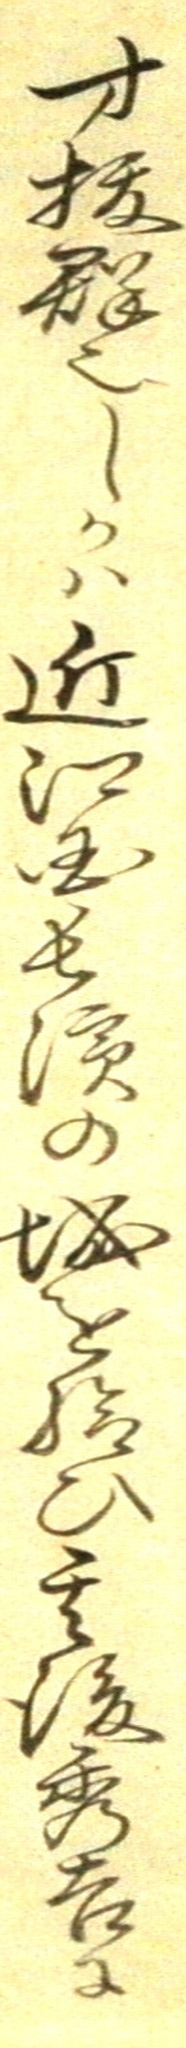才抜群也しかは近江国長浜の城を給ひ其後秀吉に
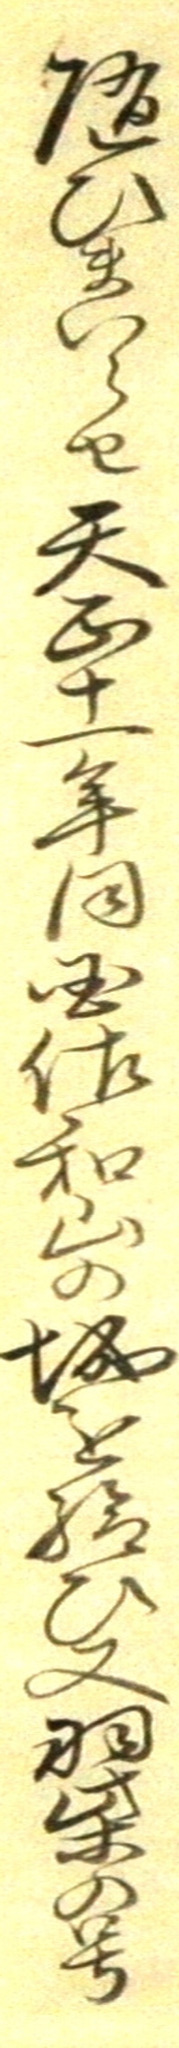随ひまいらせ天正十一年同国佐和山の城を給ひ又羽柴の号
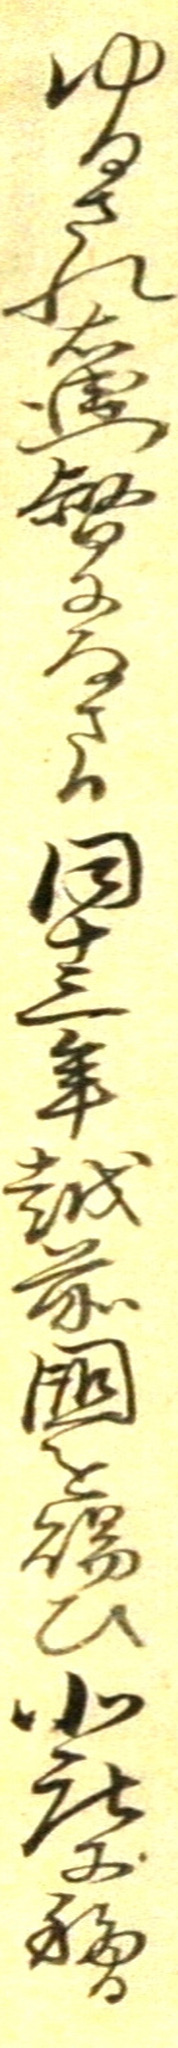ゆるされ右衛門督になさる同十三年越前国を賜ひ北庄に移る

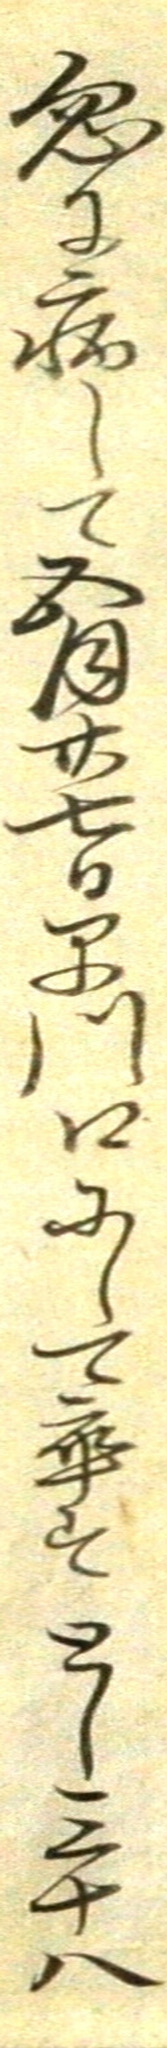忽に病して五月廿七日早川口にして卒すとし三十八
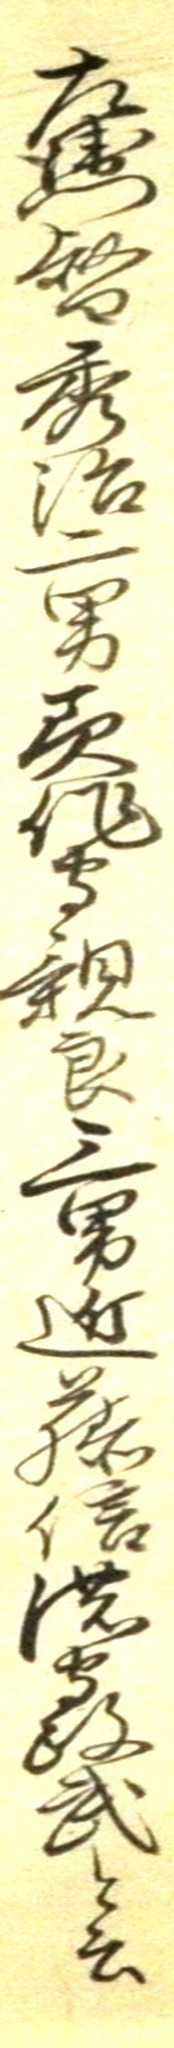左衛門督秀治二男美作守親良三男近藤信濃守正武と云
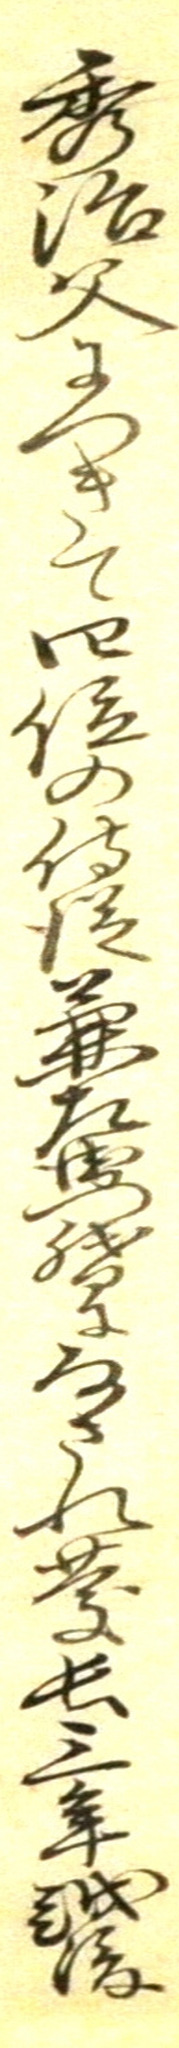秀治父につきて四位の侍従兼左衛門督になされ慶長三年越後
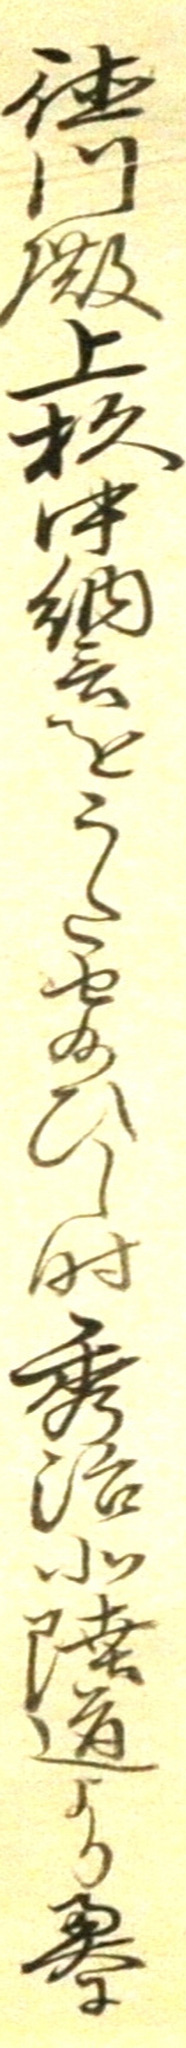徳川殿上杉中納言をうたせ給ひし時秀治北陸道より奥に
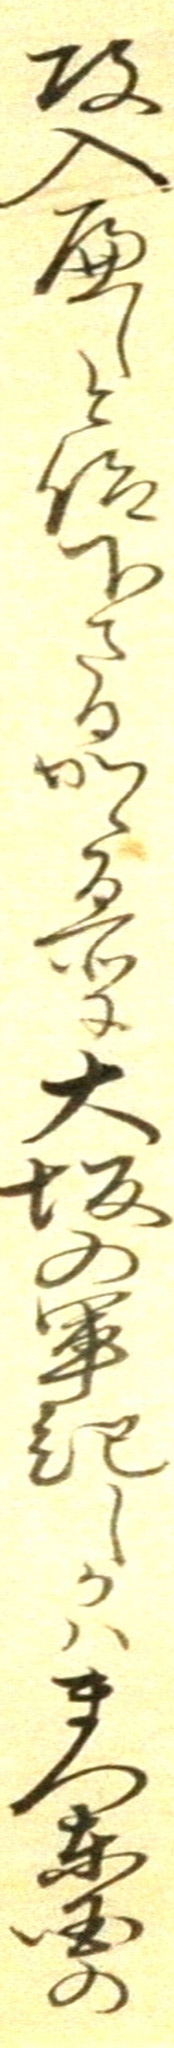攻入へしと仰下さるかゝる所に大坂の軍起しかはまつ東国の
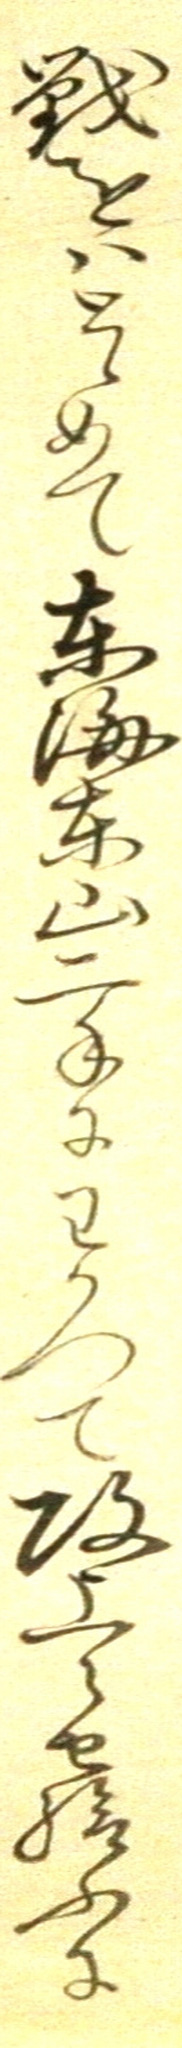戦をはとゝめて東海東山二手にわかつて攻上らせ給ふに
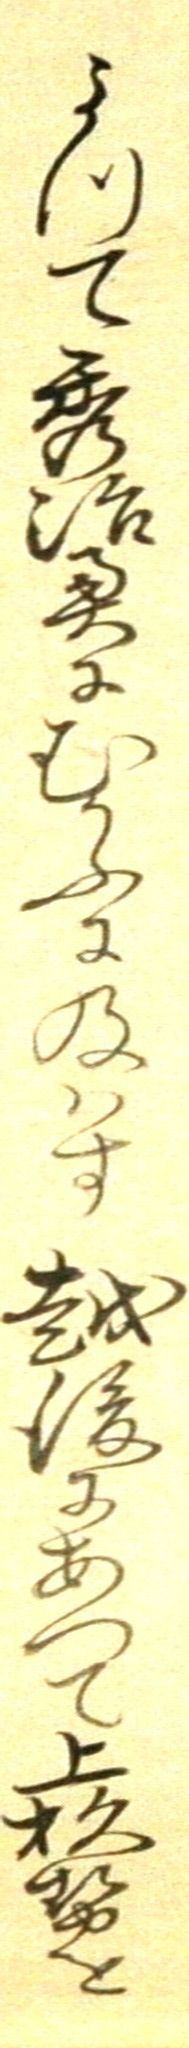よつて秀治奥にむかふに及はす越後にあつて上杉勢を
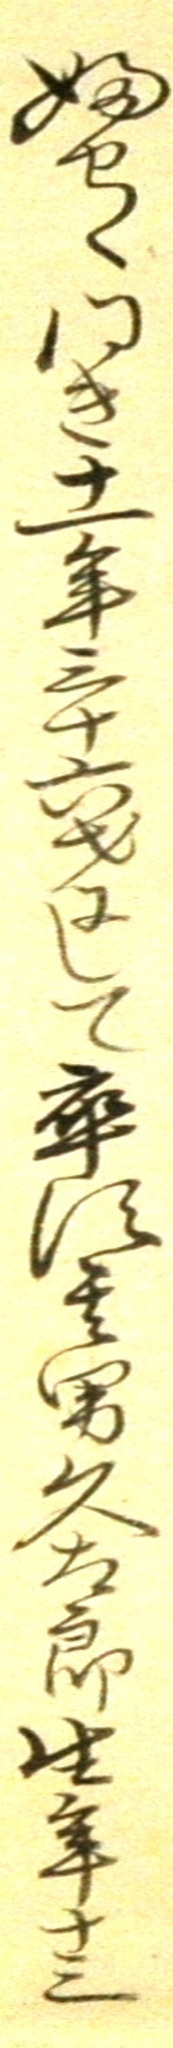ふせく同き十一年三十六才にして卒す其男久太郎生年十三
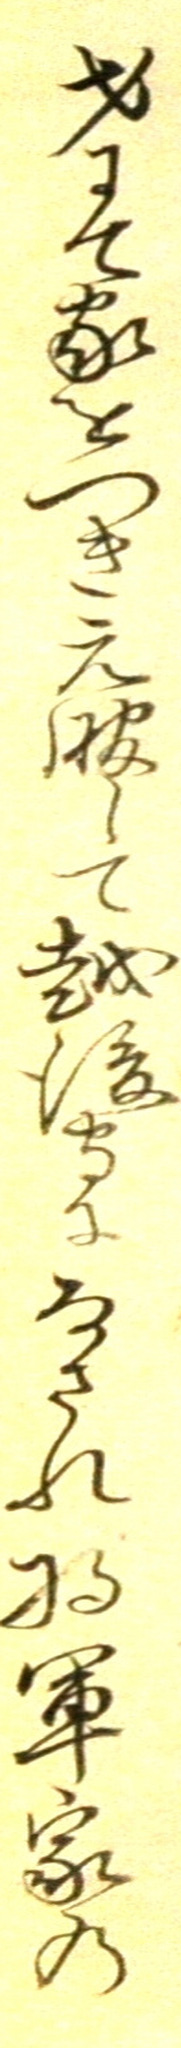才にて家をつき元服して越後守になされ将軍家の

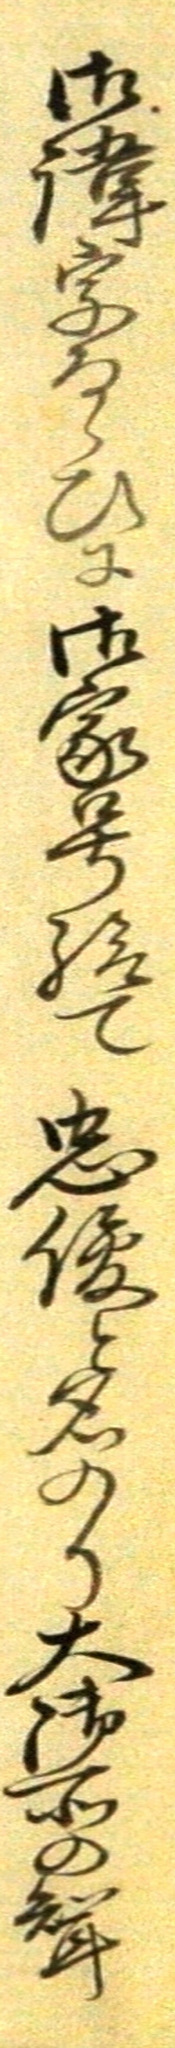御諱字ならひに御家号給て忠俊と名のり大御所の聟
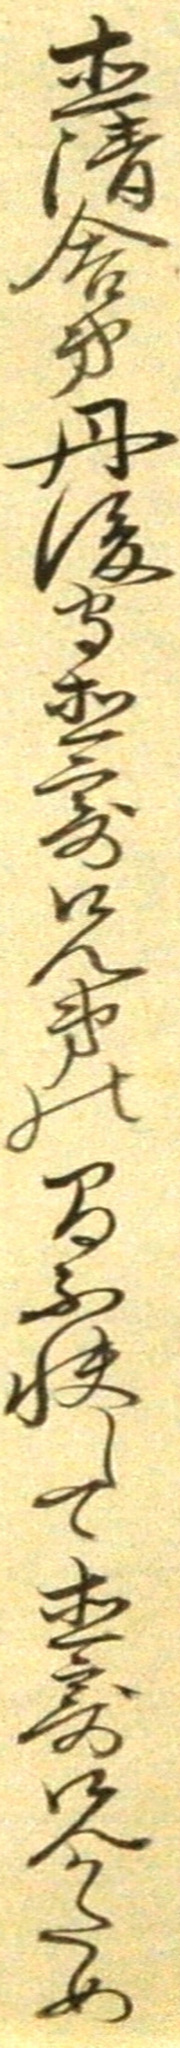直清舎弟丹後守直寄兄弟の間不快して直寄兄かため
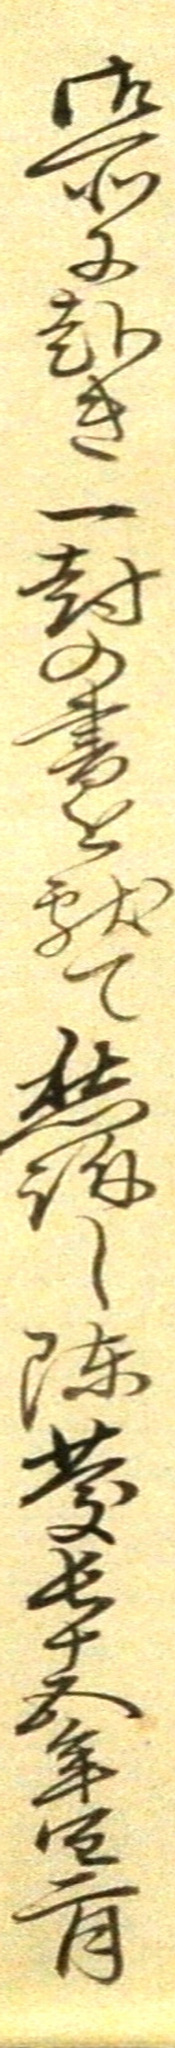御所に赴き一封の書を献て愁訴し陳慶長十五年閏二月
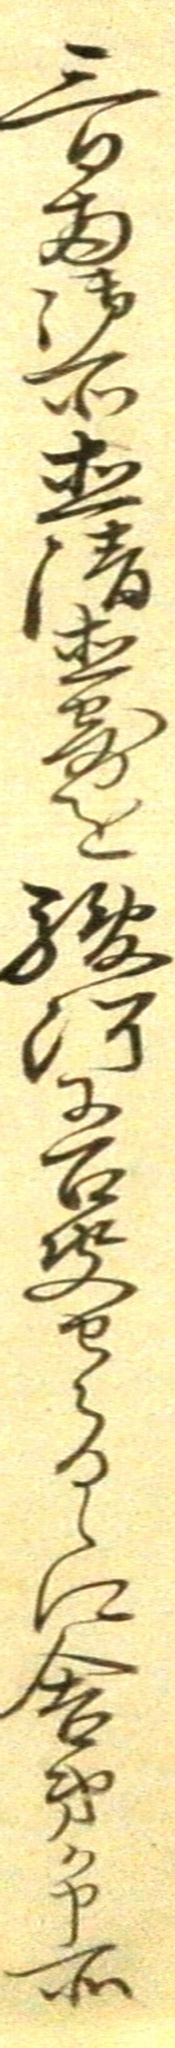三日両御所直清直寄を駿河に召決せらるゝに舎弟か申所
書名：藩翰譜（七・上）
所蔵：伊那市立高遠町図書館・合同会社AMANE
